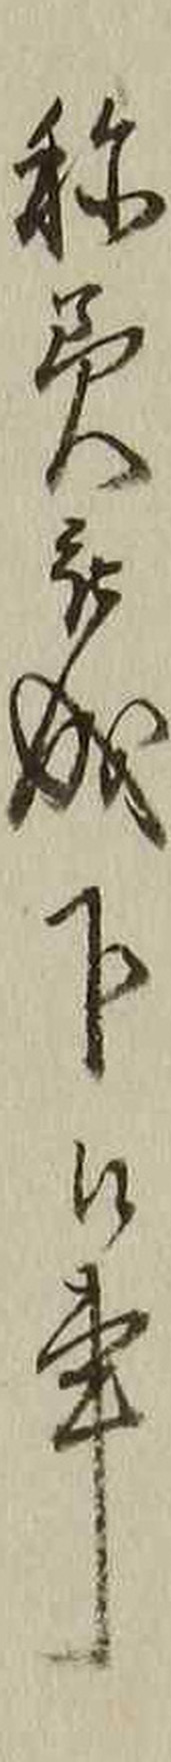称美被成下候事
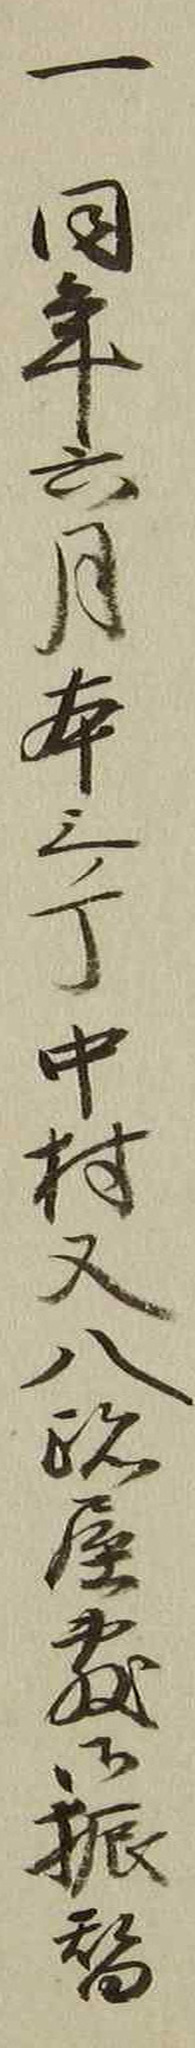一同年六月本三ノ丁中村又八跡屋敷御振替
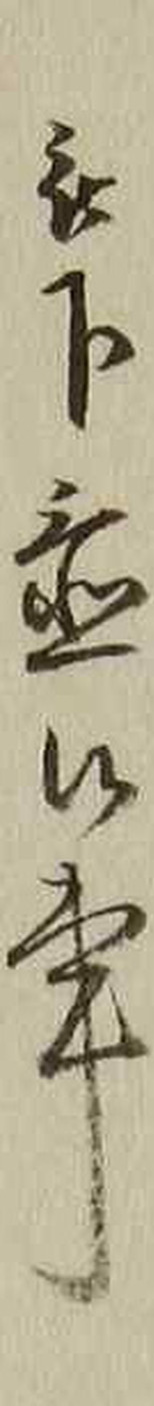被下置候事
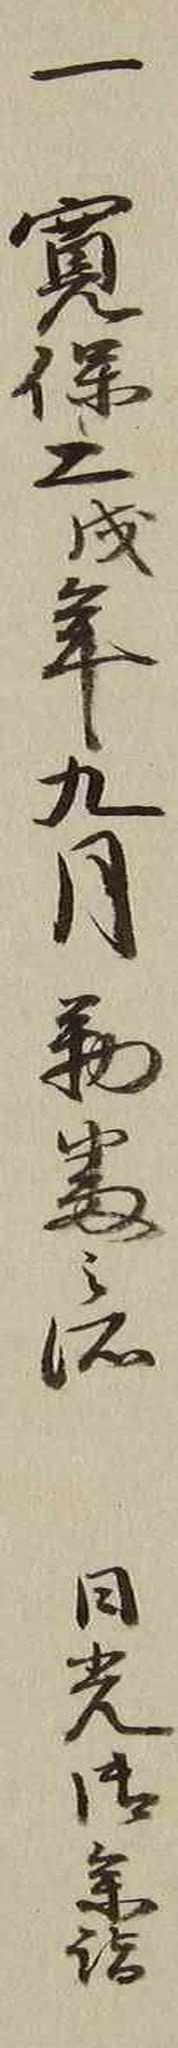一寛保二戌年九月勤番之所日光御参詣
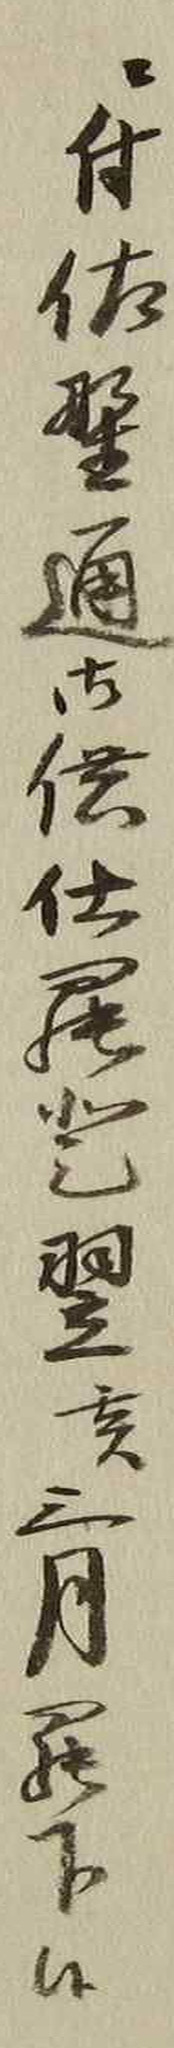ニ付佐野通御供仕罷登翌亥三月罷下候
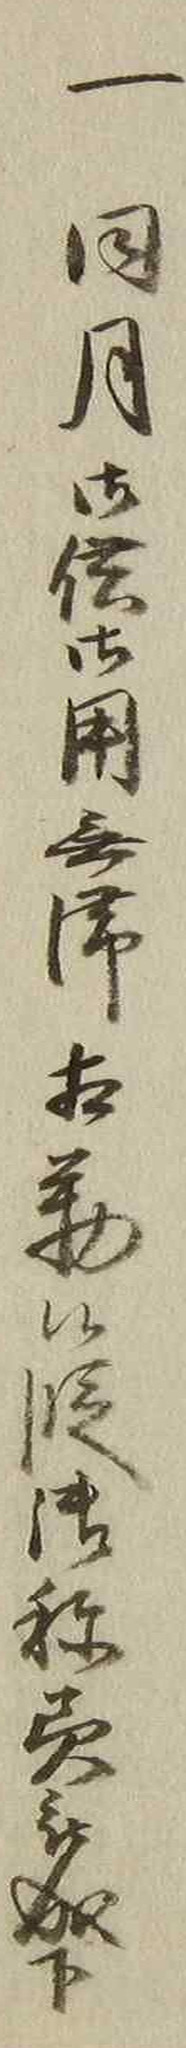一同月御供御用無滞相勤候段御称美被成下
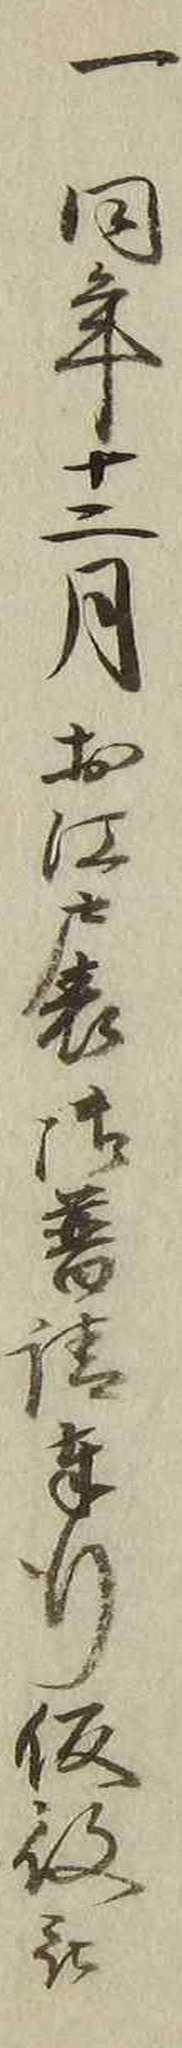一同年十二月於江戸表御普請奉行仮役被
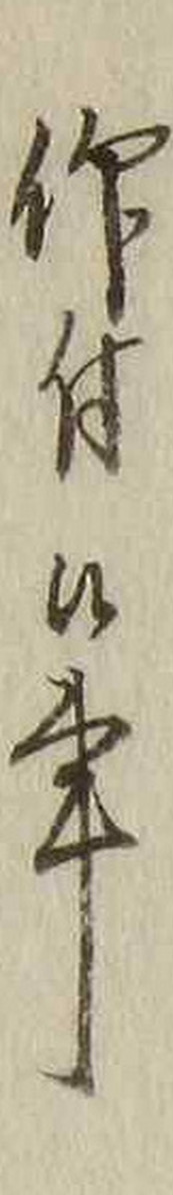仰付候事
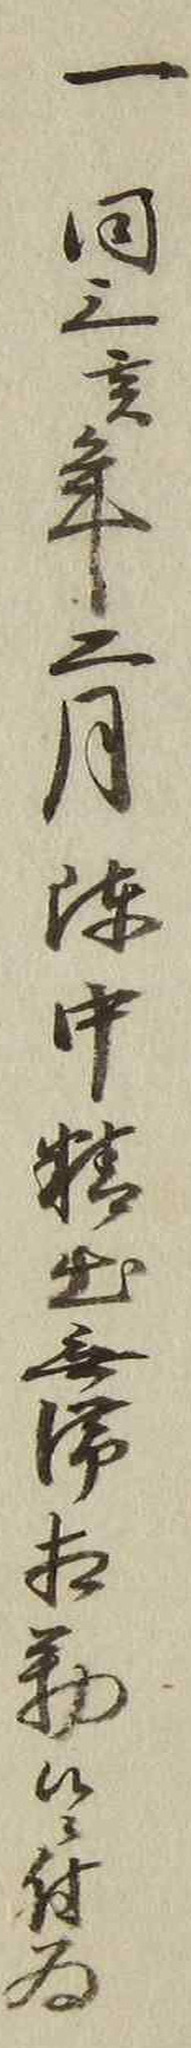一同三亥年二月陣中精出無滞相勤候ニ付為
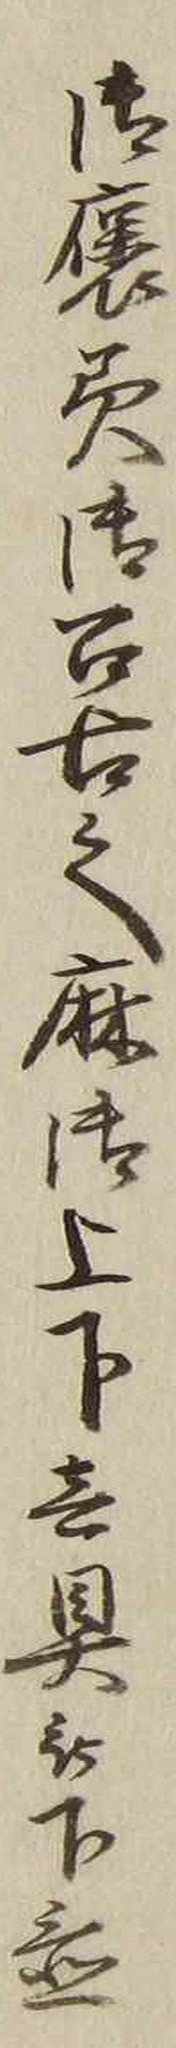御褒美御召古之麻御上下壱具被下置
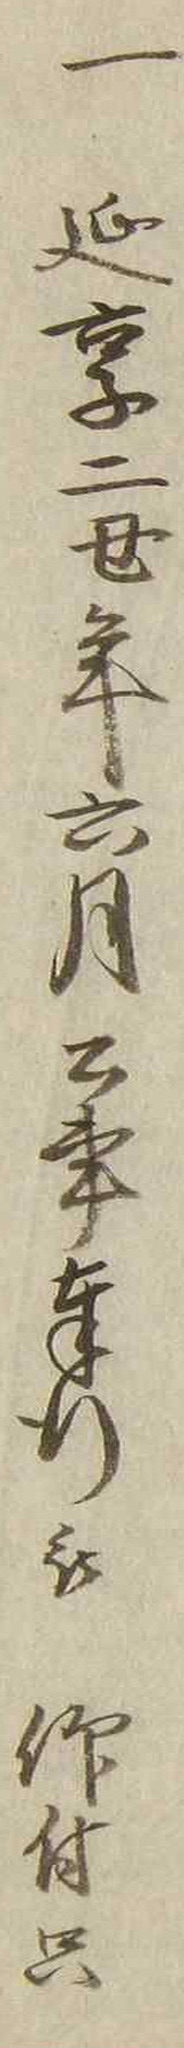一延享二丑年六月公事奉行被仰付只

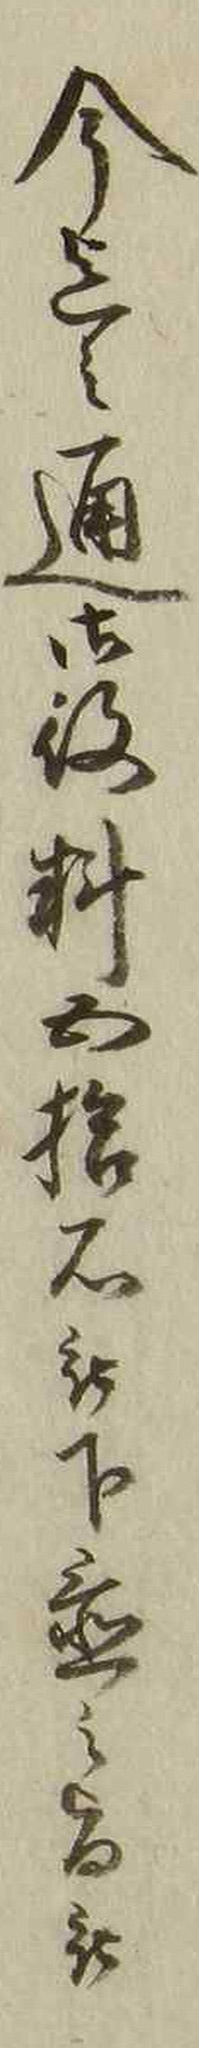今迄之通御役料五拾石被下置之旨被
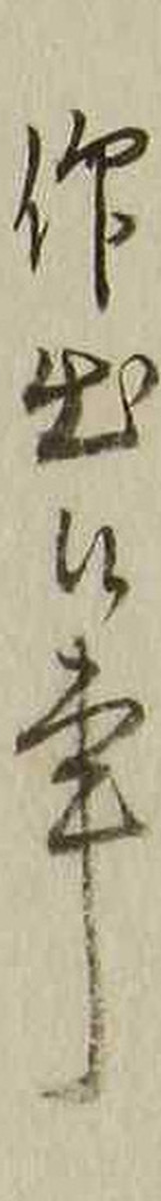仰出候事
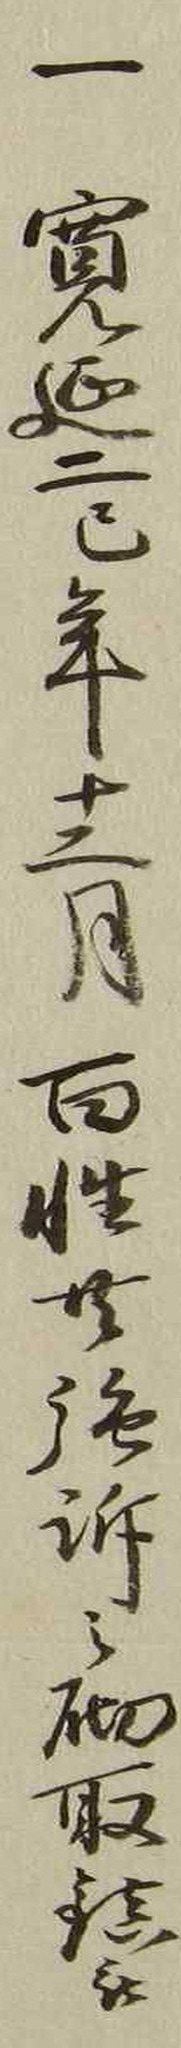一寛延二巳年十二月百性共強訴之砌取鎮被
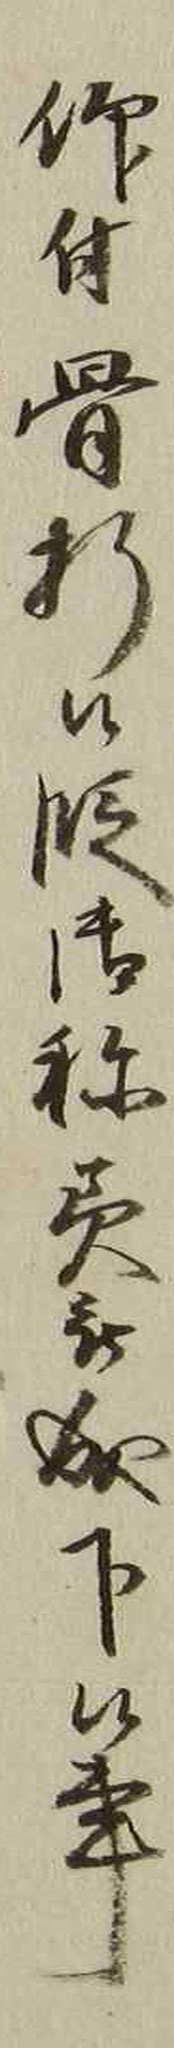仰付骨折候段御称美被成下候事
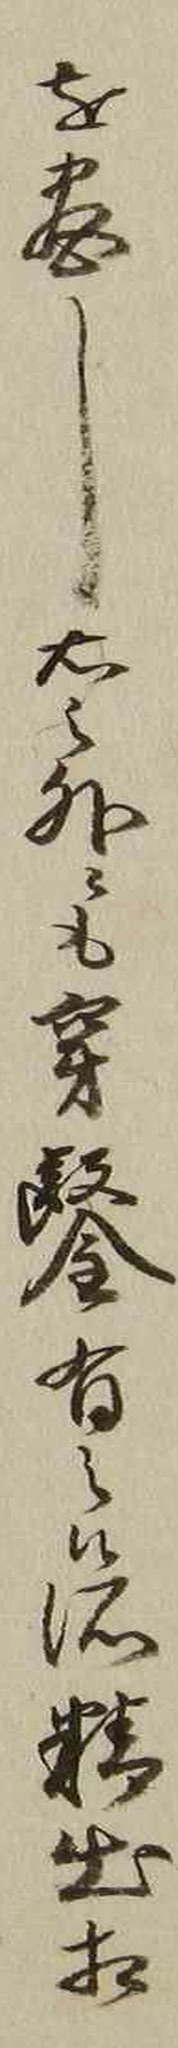を尽し右之外ニも穿鑿有之候所精出相
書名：諸士系譜　巻之128　た之部4
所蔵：会津若松市立会津図書館
